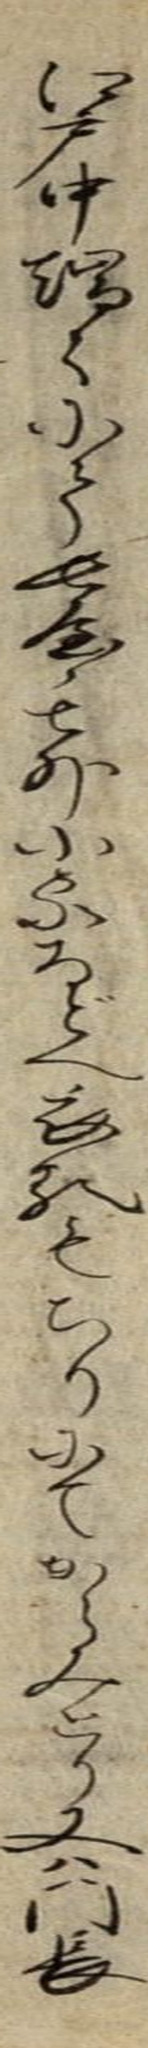一江戸中端々にて長屋其外小家などへ衣類もちりにてからみとり又は門長
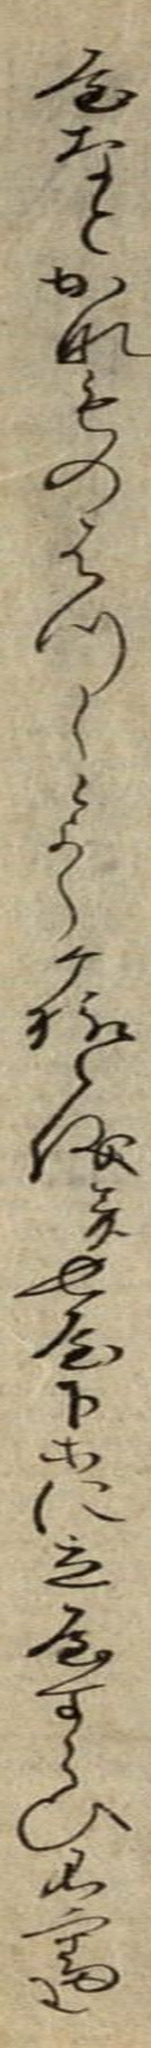屋なとかなものはつし候よしケ様之儀幷長屋下等に立やすらひ不審に
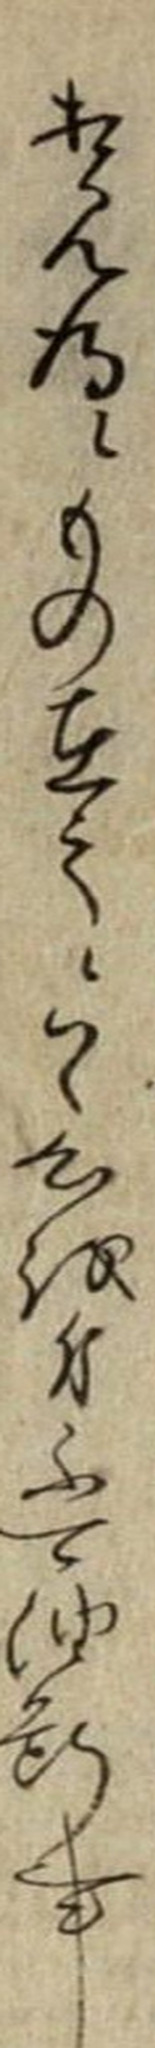相見え候もの在之候はゝ心を付不可油断事
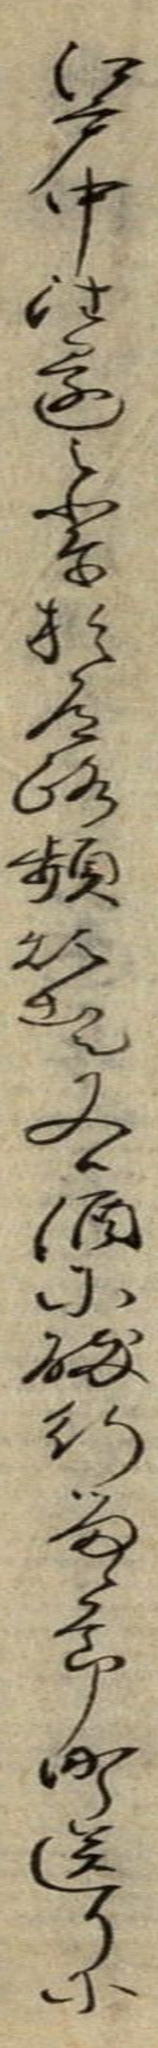一江戸中往還之輩於道路頻煩出し又は酒に酔行留候節町送りに
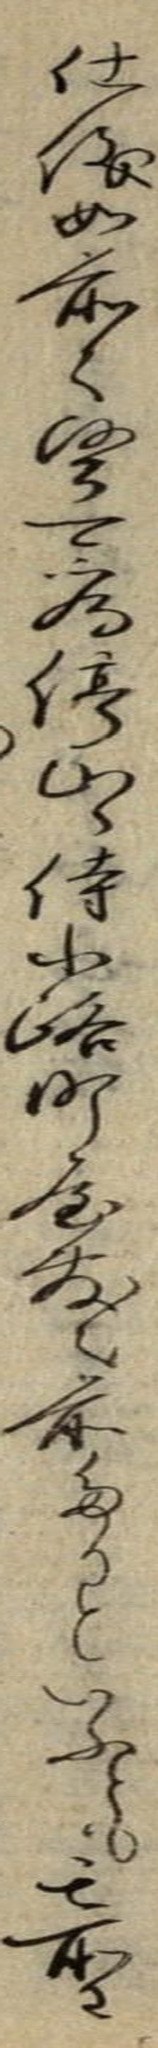仕儀如前々堅可為停止候侍小路町屋敷之前たりといふとも其所に
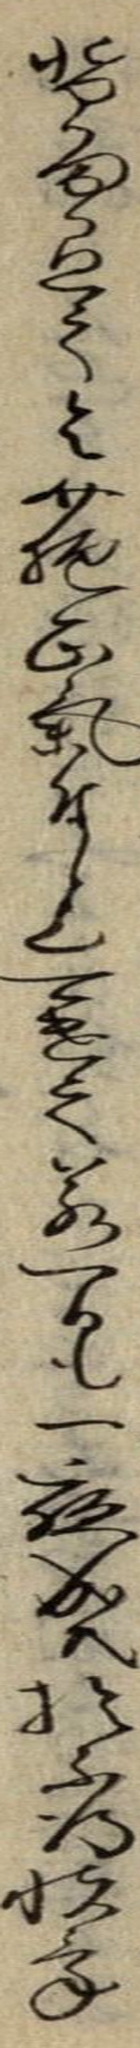暫留置之候令介抱正気付候上可遣之若一日も一夜成共於不得快気
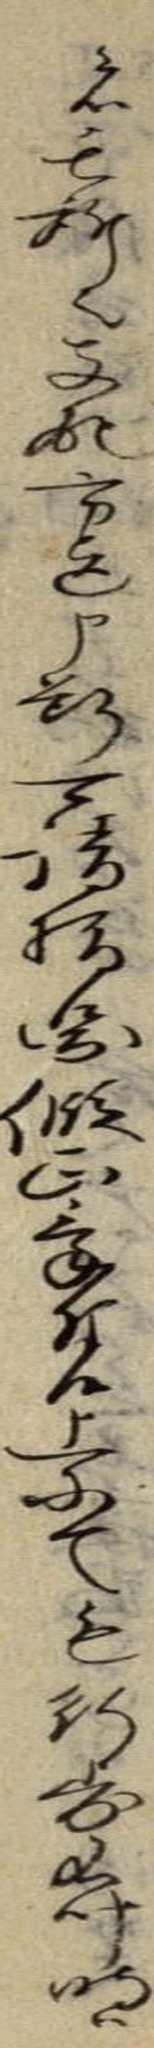は其所之支配方迄申断可請指図仮正気付候上にても行歩不叶時は
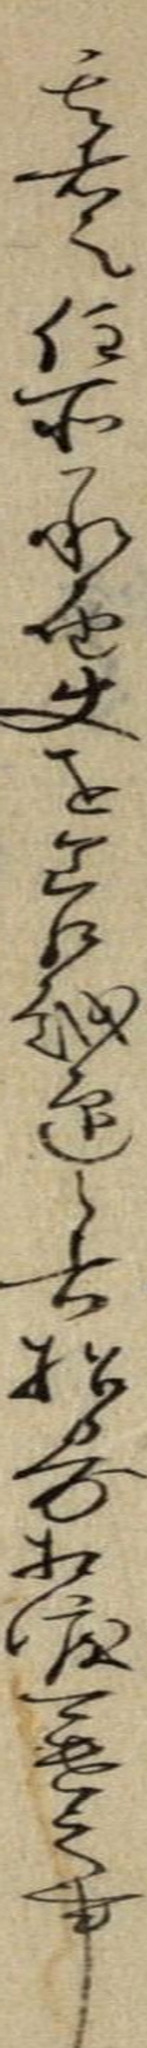其者之住所承届使を差越迎之者招寄相渡可遣之事
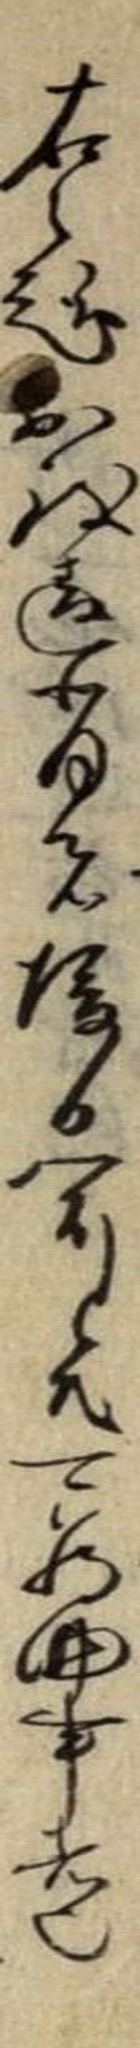右之趣於致違背は後日聞候共可為曲事者也
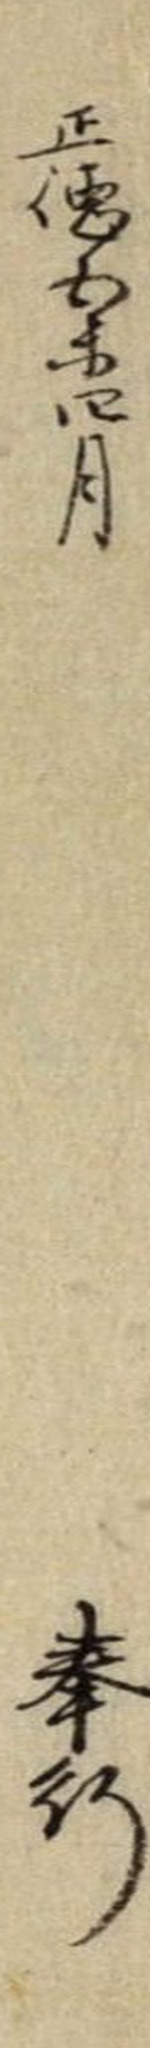正徳五未四月奉行
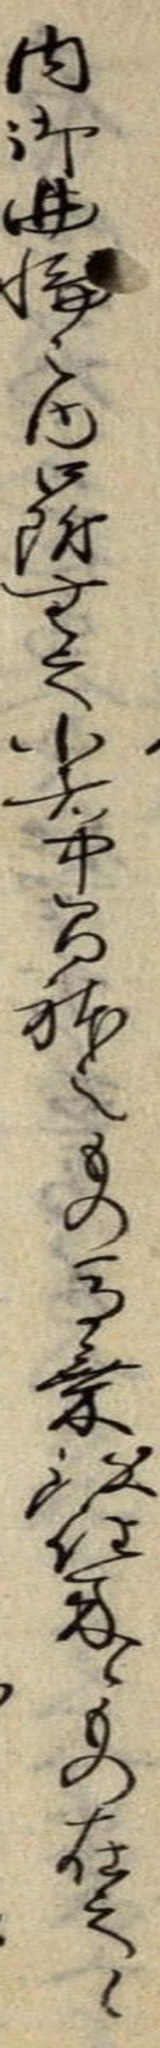内御曲輪之内口附無之小者中間体のもの馬乗致往来候もの在之候
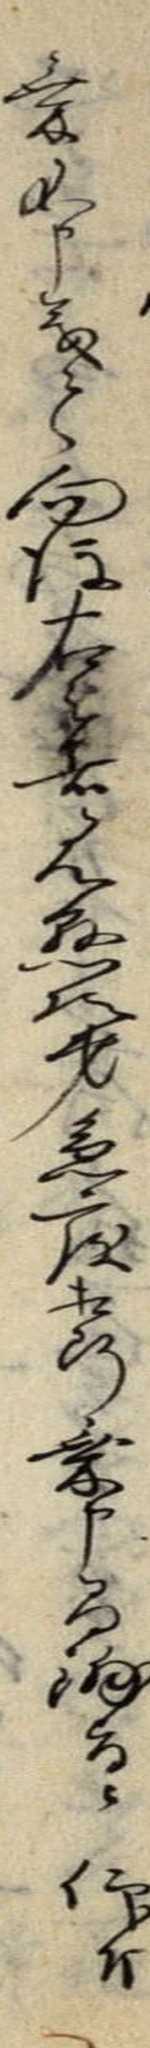乗不申義に候向後右之者見懸次第急度相断乗申間鋪旨被仰付
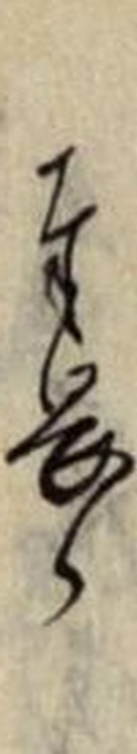奉畏候
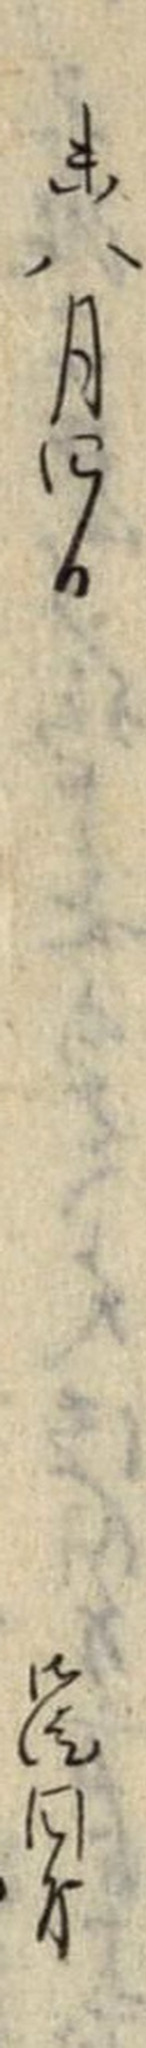未八月四日御徒目付
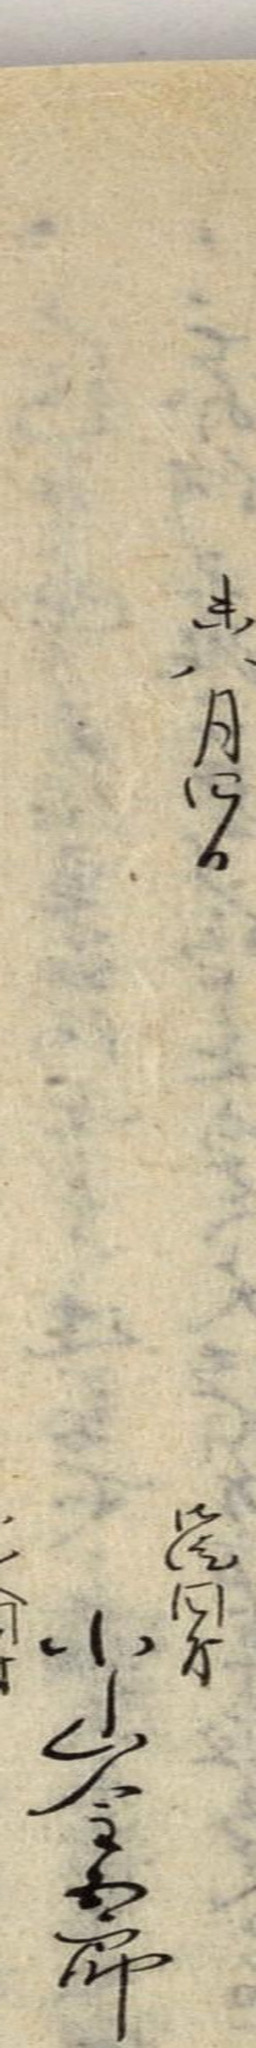小山金五郎
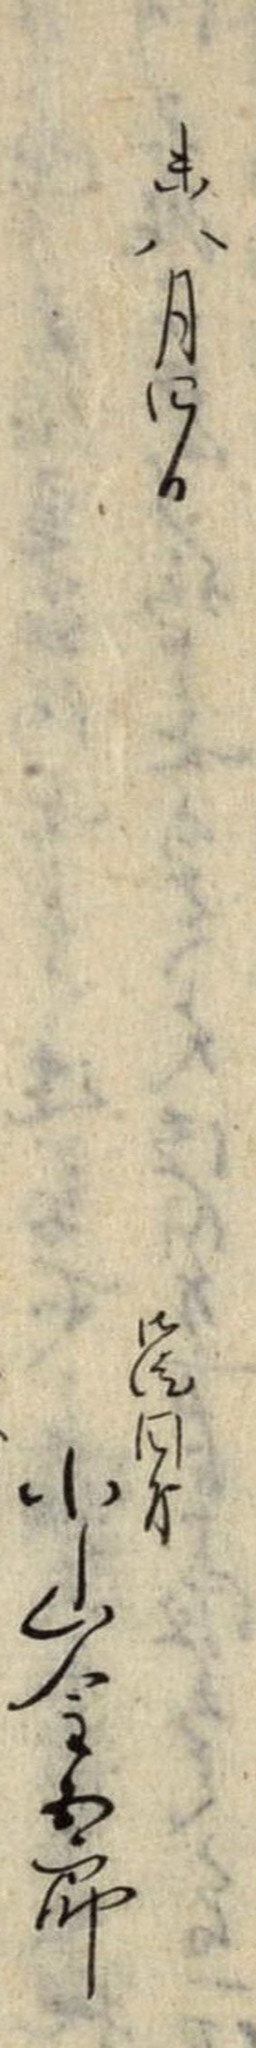小山金五郎
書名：三都并道中之部
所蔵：福井県文書館 Fukui Prefectural Archives
